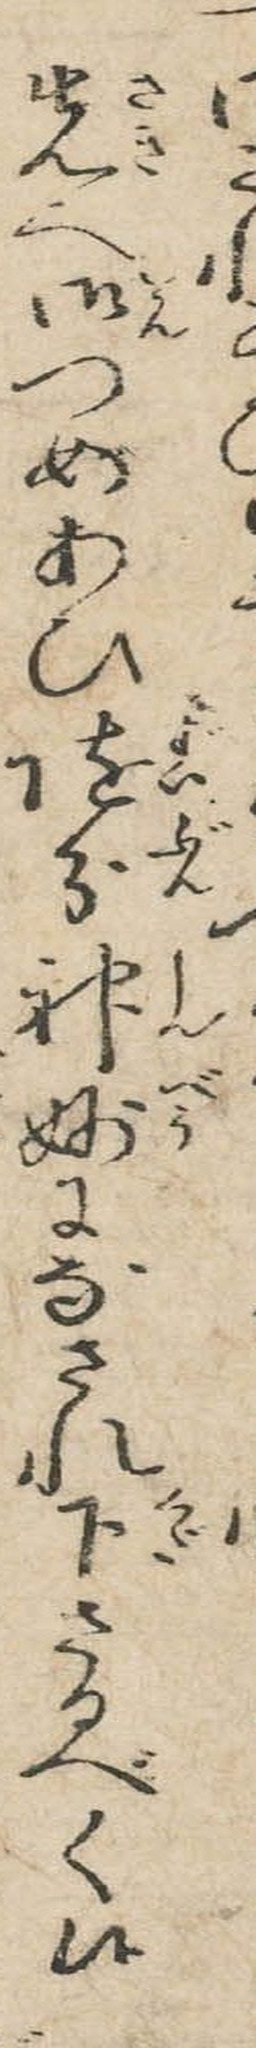先へ御つめあひ随分神妙になされ下さるべく候
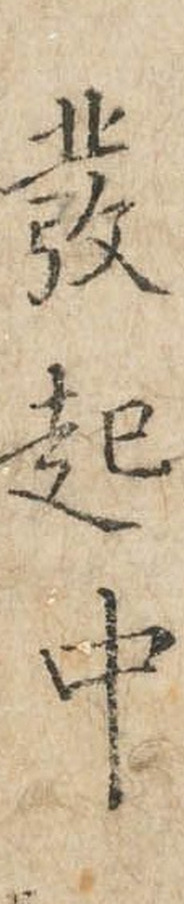発起中

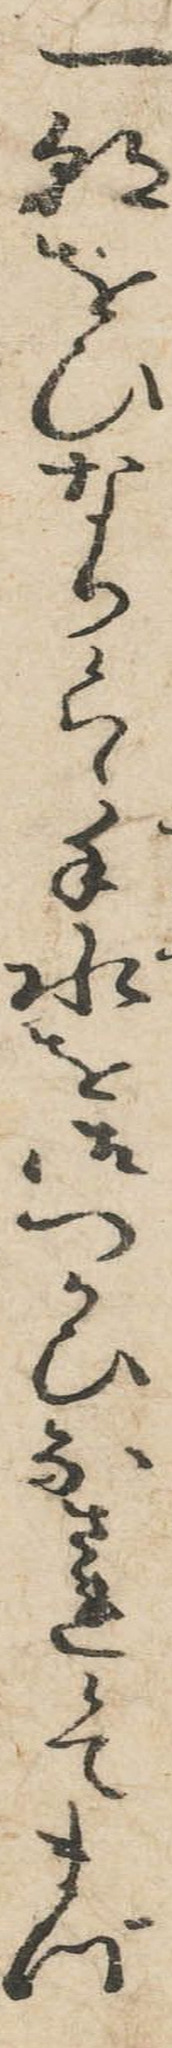一朝をひなり候はゝ手水を御つかひなされ候てまづ
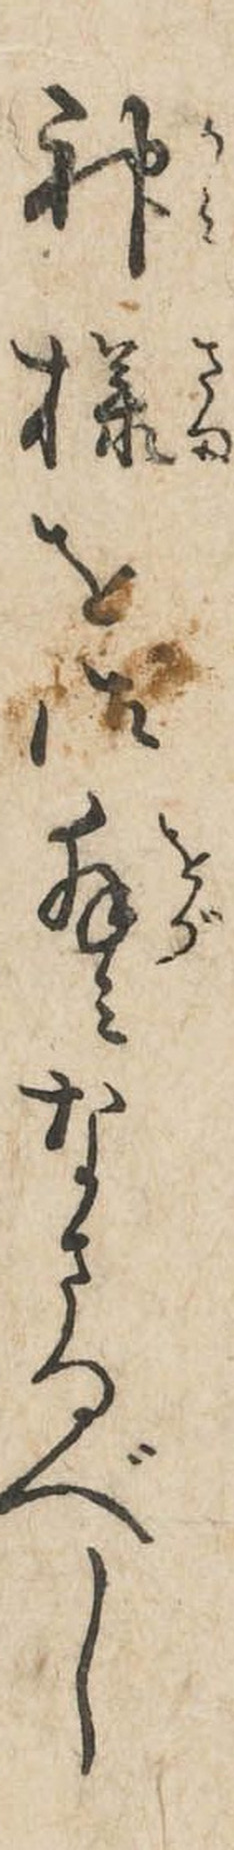神様を御拝みなさるべし
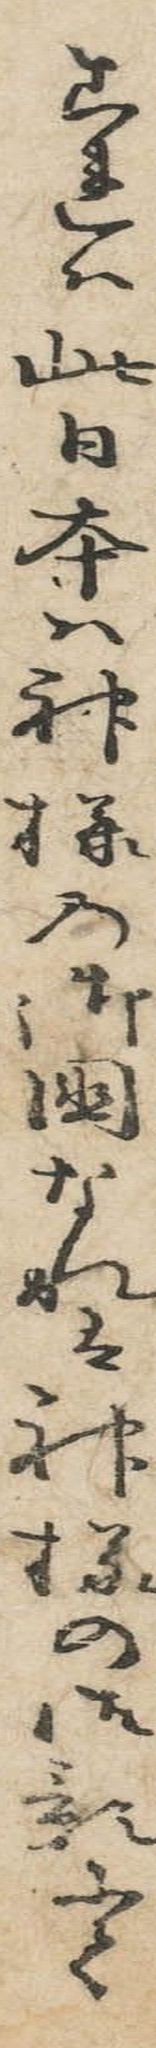これは此日本は神様乃御国なれは神様の御影にて
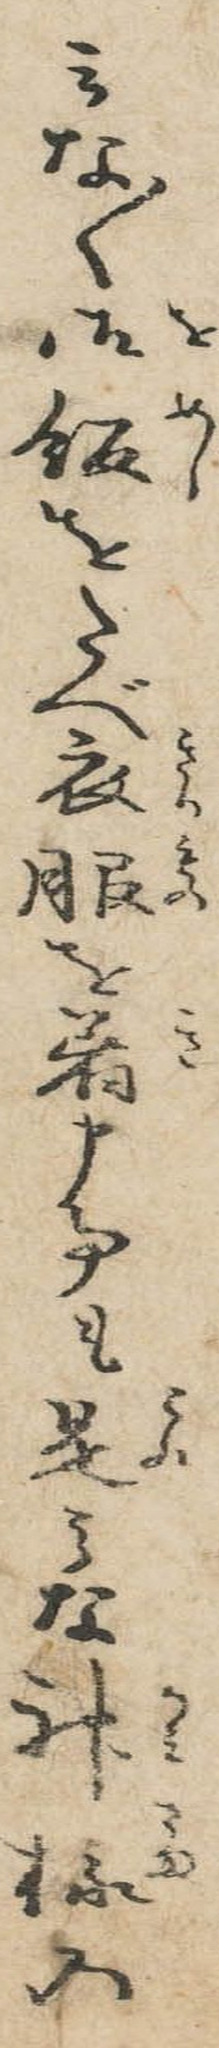みな〳〵御飯をたべ衣服を着申事も是みな神様乃
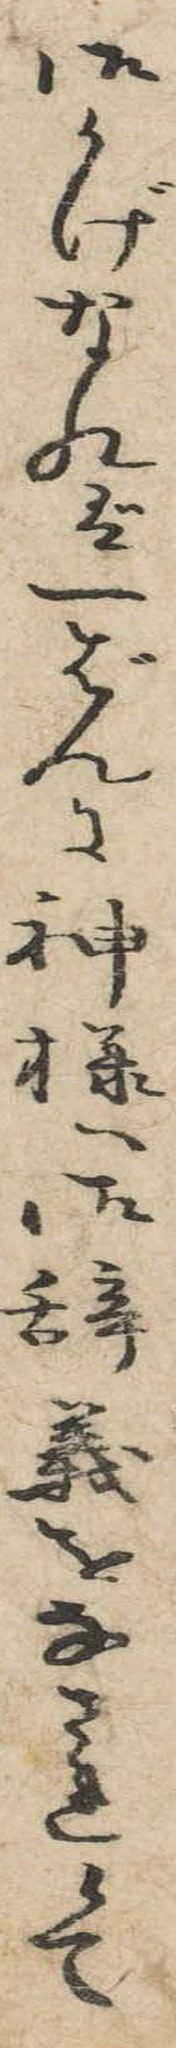御かげなれば一ばんに神様へ御辞儀をなされ候て
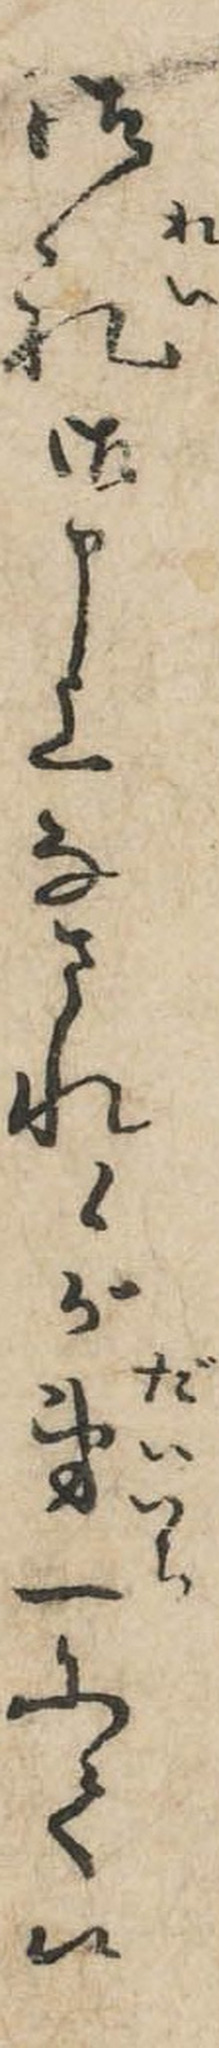御礼御申上なされ候が第一にて候
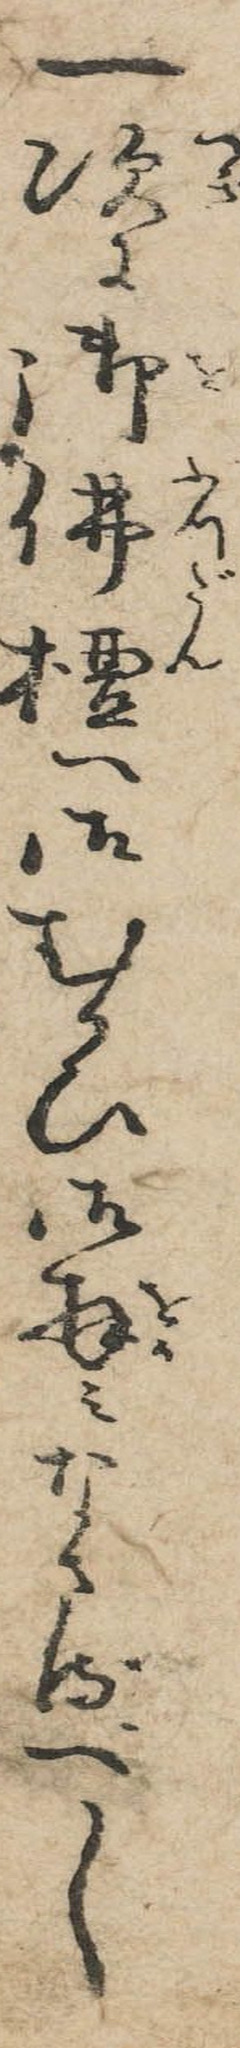一次に御仏壇へ御むかひ御拝みなさるへし
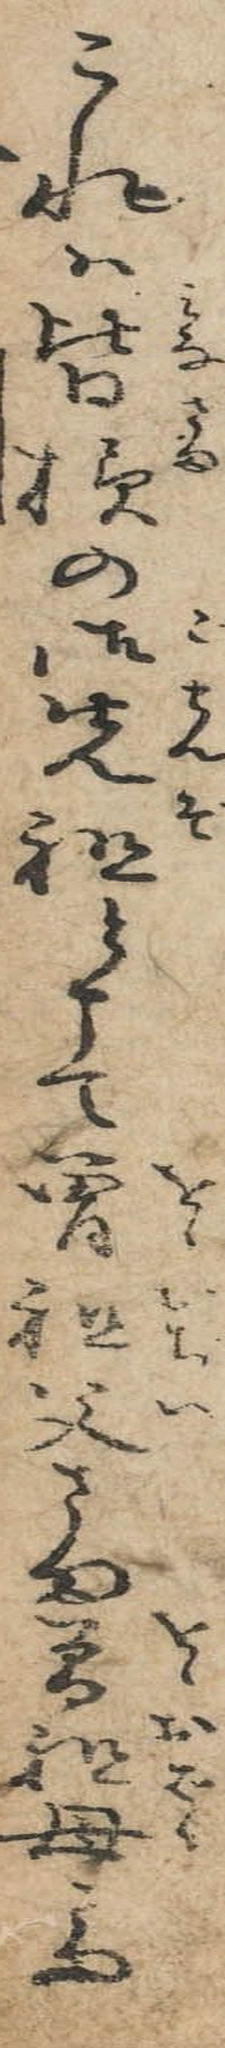これは皆様の御先祖と申て曽祖父さま曽祖母さま

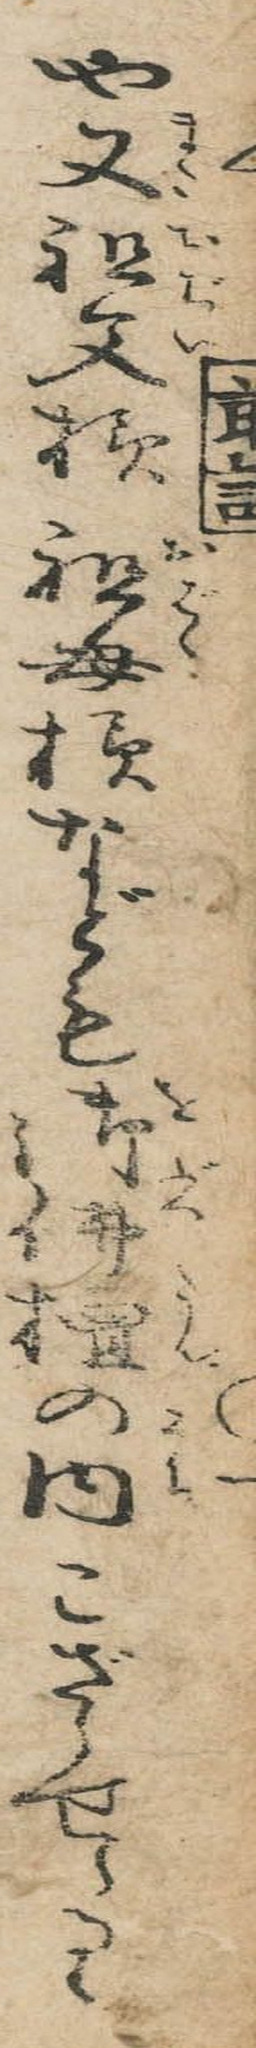や又祖父様祖母様なども御仏壇の内こざらせらるゝ
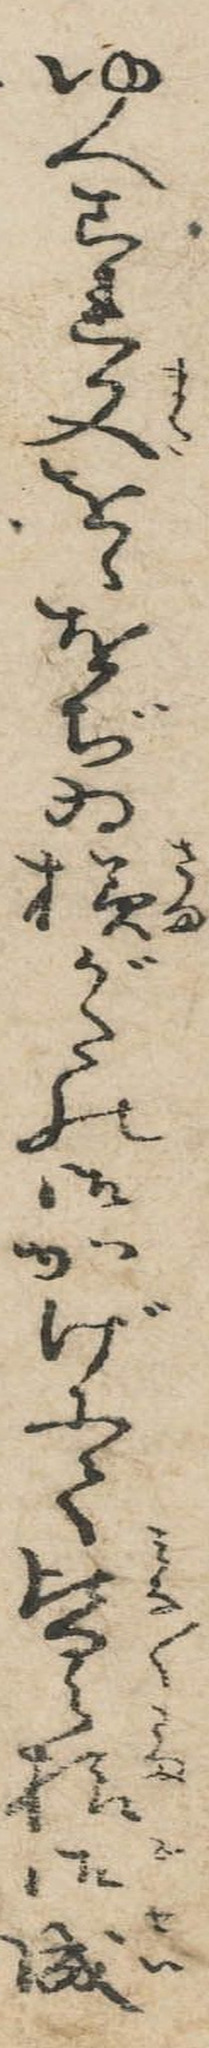ゆへこれ又をゝをぢゐ様がたの御かげにて皆々様御成
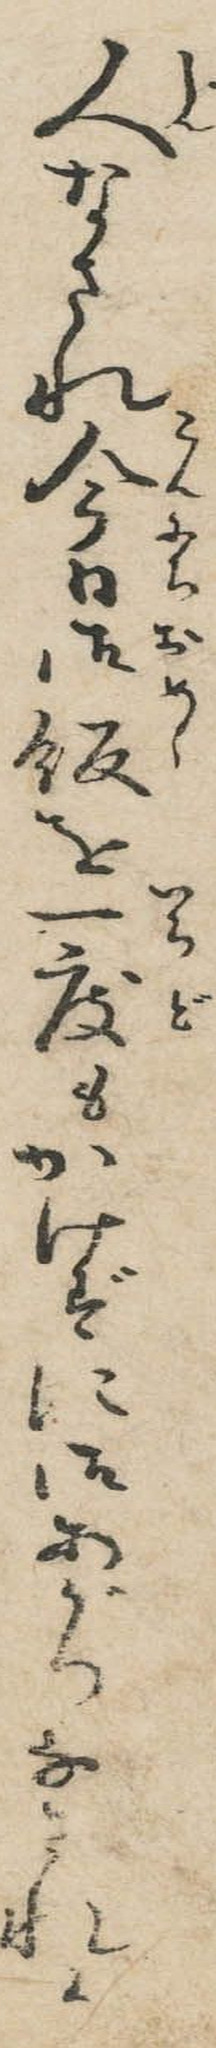人なされ今日御飯を一度もかけずに御あがりなされ候
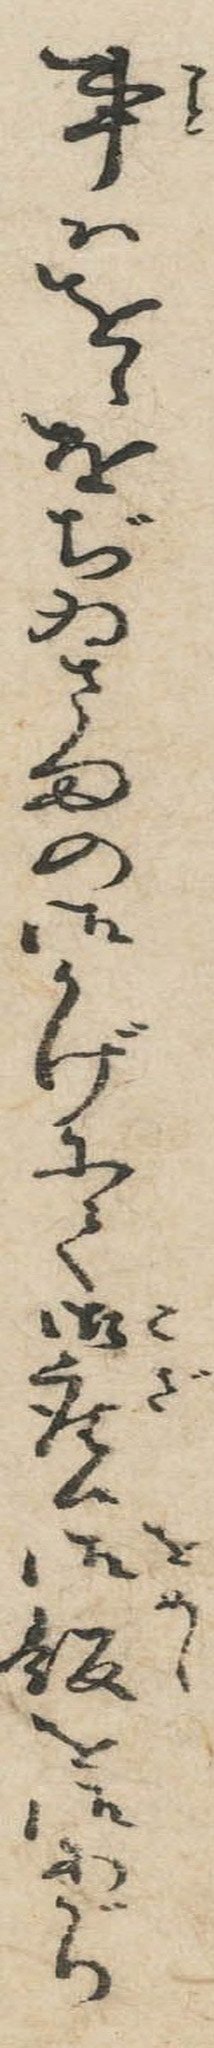事はをゝをぢゐさまの御かげにて御座候御飯を御あがり
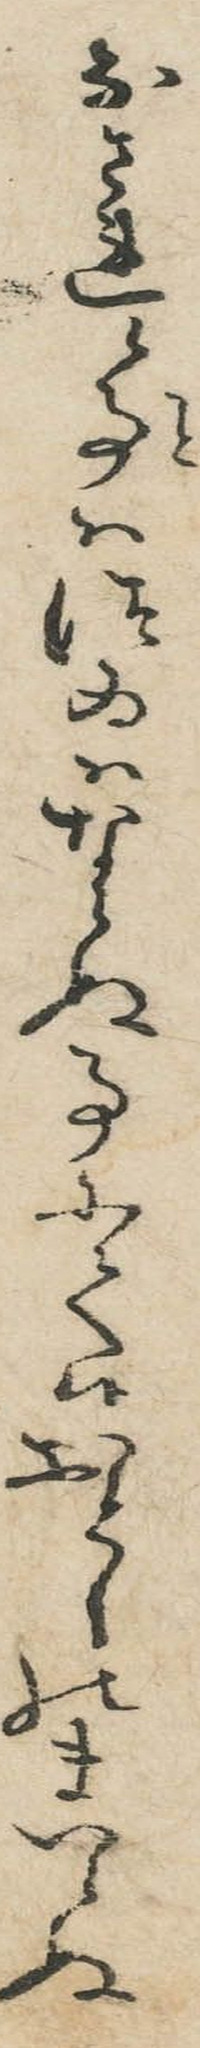なされ候事はつゐはならぬ事にて候おとしのまいらぬ
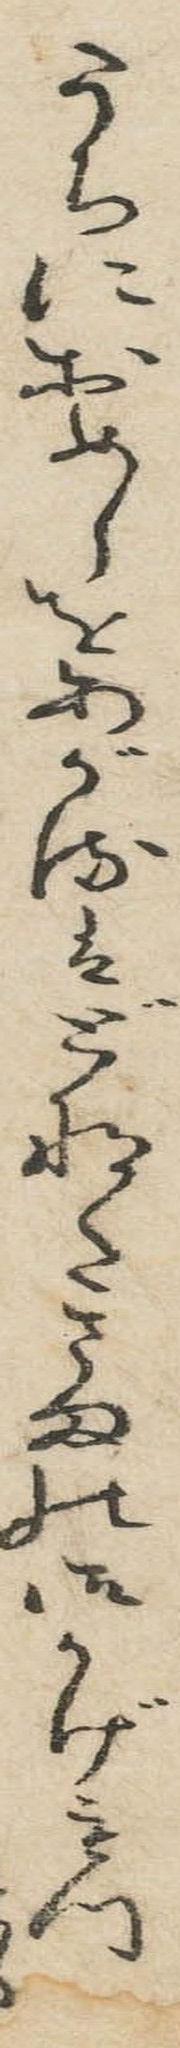うちにおめしをあがるはどなたさまの御かげもつとも
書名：前訓
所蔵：東京学芸大学附属図書館
